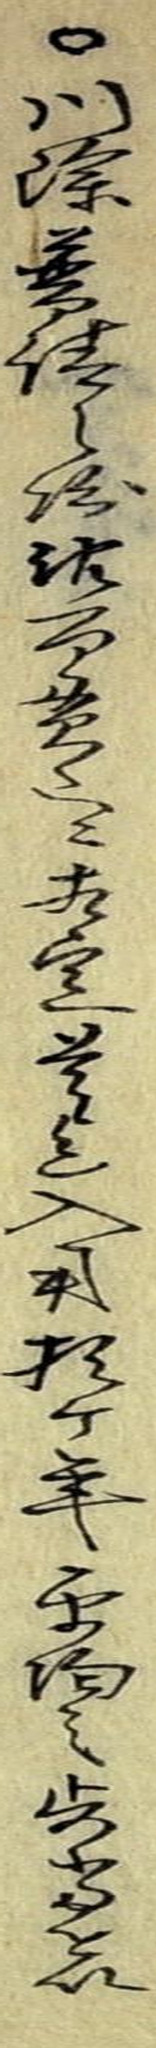〇川除普請之儀銀百貫匁ニ相定是迄入用拾ケ年平均之歩当を以
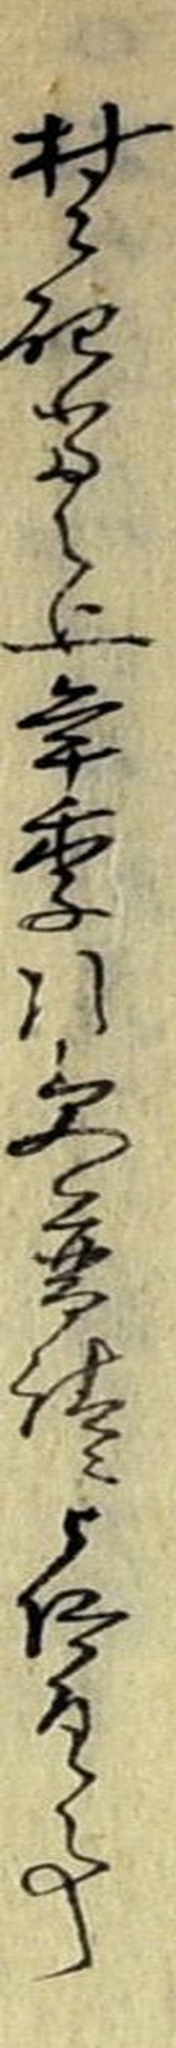村々配当之上年季引受普請ニ被仰付候事
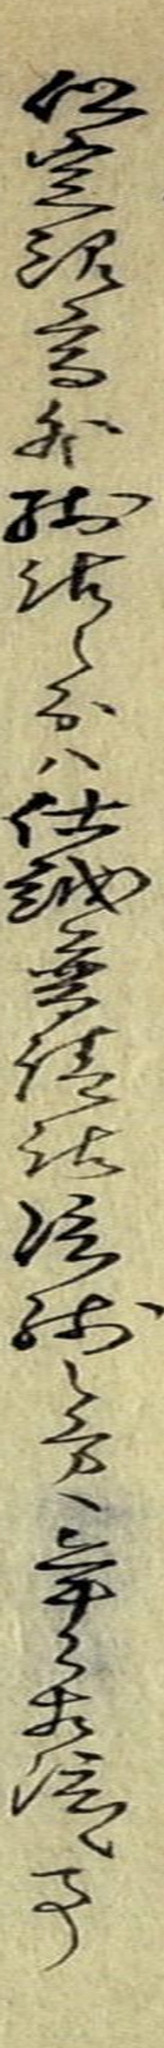但定銀高外残銀之分ハ仕越普請銀渡残之方へ年々相渡候事
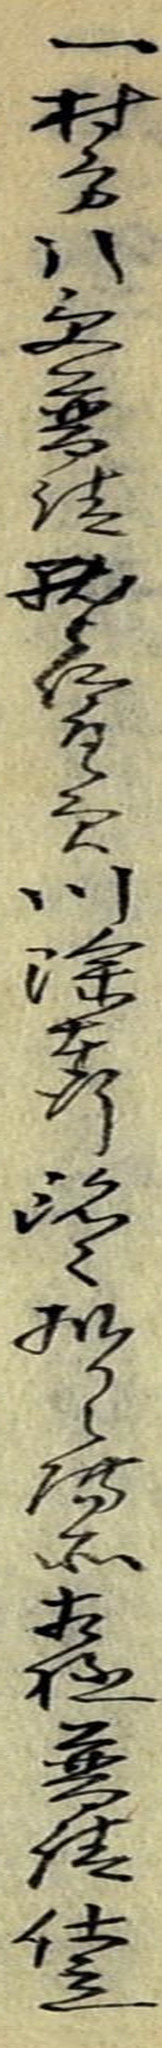一村方引受普請就被仰付候而ハ川除奉行銘々掛り之場所相極普請仕立
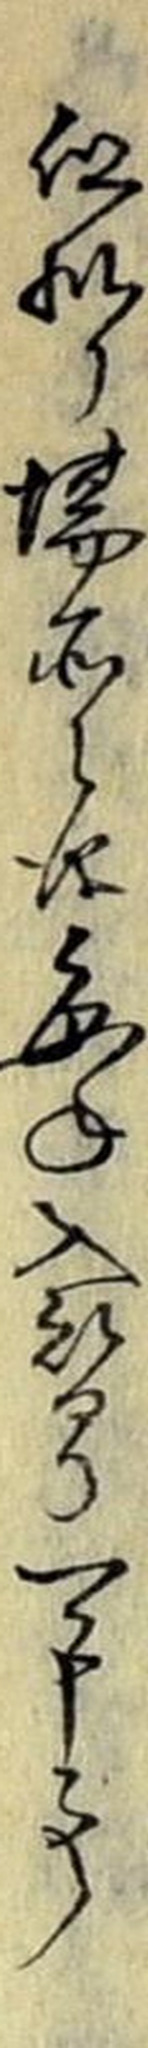但掛り場所之儀毎年入替り可申事
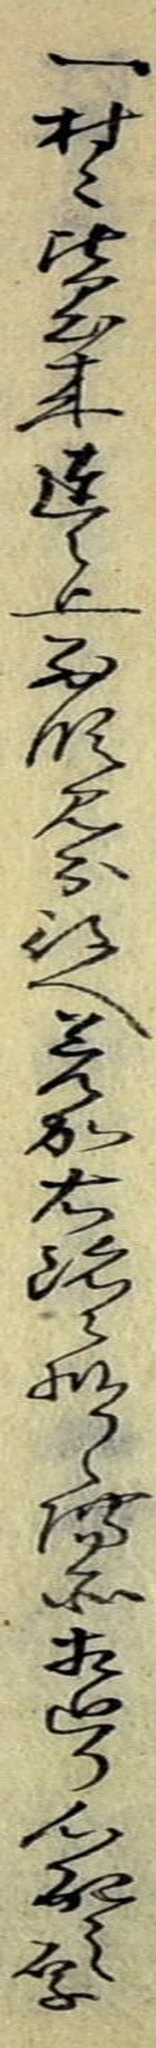一村々皆出来達之上別段見分役人差加右銘々掛り場所相廻り心配之厚
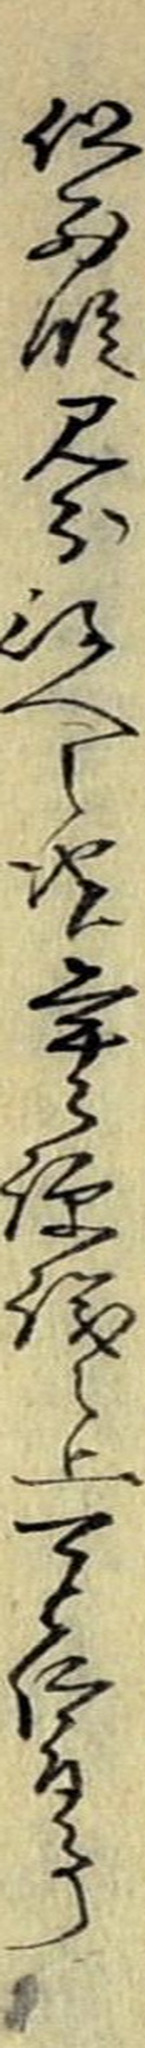但別段見分役人之儀ハ年々評議之上可被仰付事
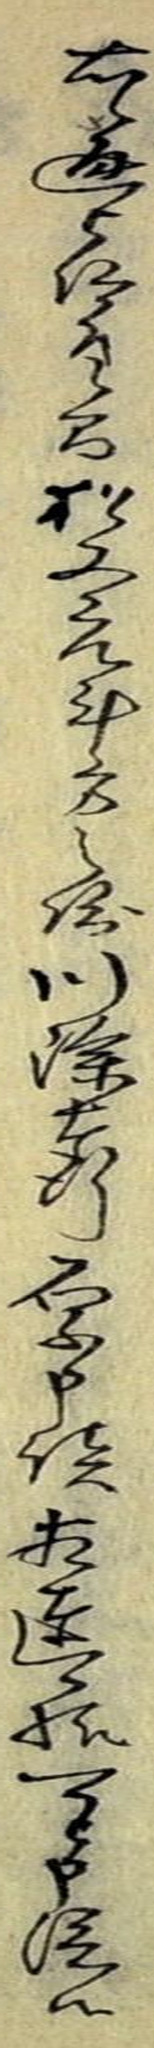右之通被仰付候間猶又取計之儀川除奉行厚申談相達候様可被申渡候
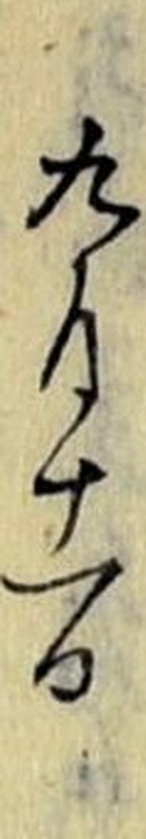九月十一日
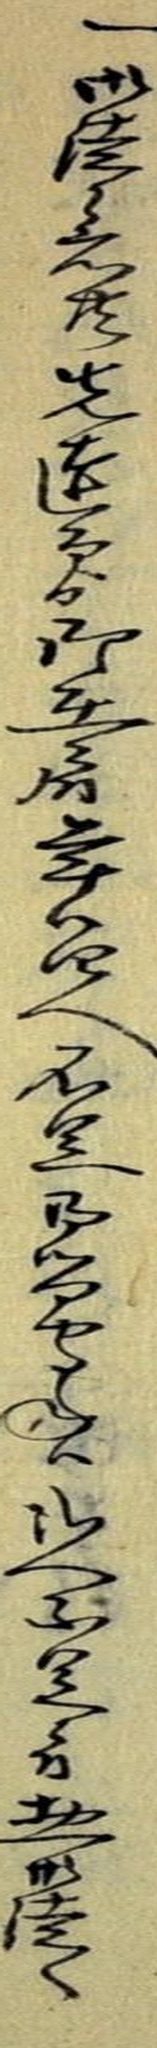一御徒之者共先達而ゟ御在府年ハ四人不足御留守年ハ弐人不足ニ付惣御徒へ
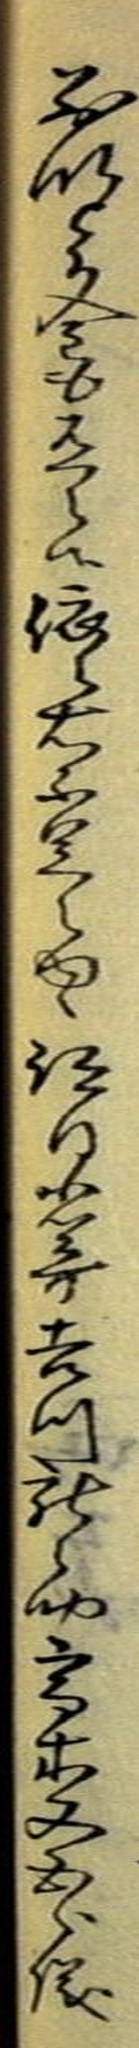別段被下金も有之候依之右不足之内へ跡目小算吉川新之助高木又五郎儀
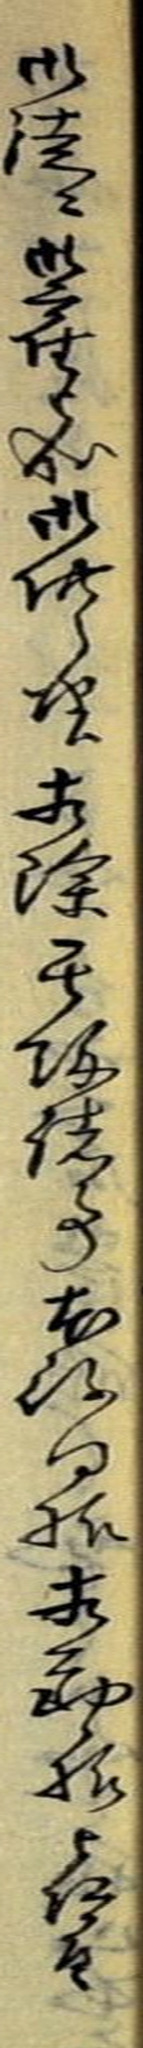御徒ニ御雇被成御供之儀ハ相除其余諸事本役同様相勤候様被仰付候
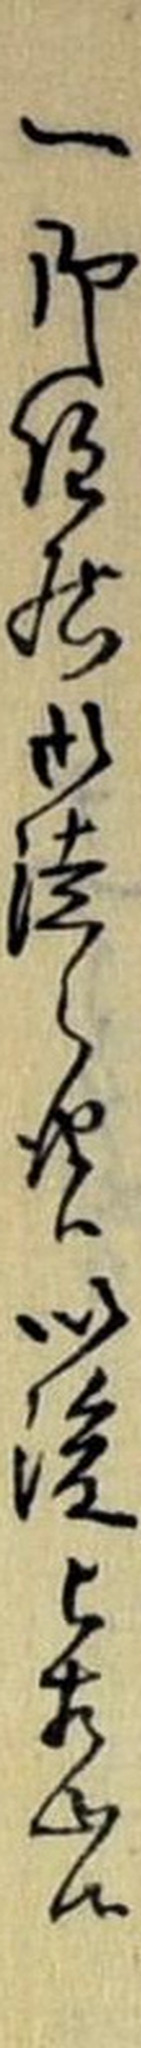一御住居御徒之儀ハ以後被相止候
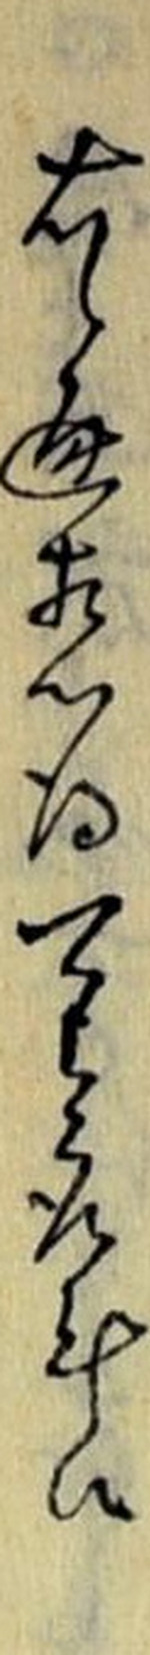右之通相心得可被取計候
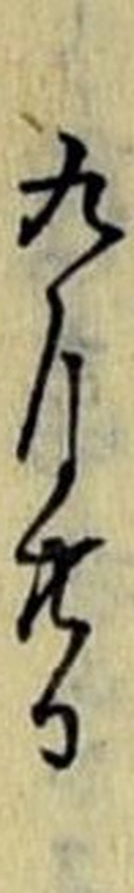九月廿日
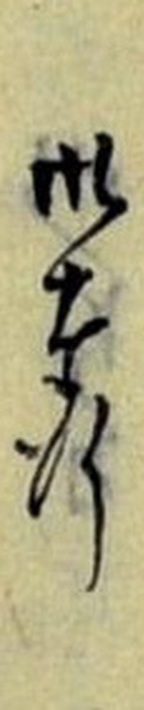御奉行
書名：命令之部 五
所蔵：福井県文書館 Fukui Prefectural Archives
